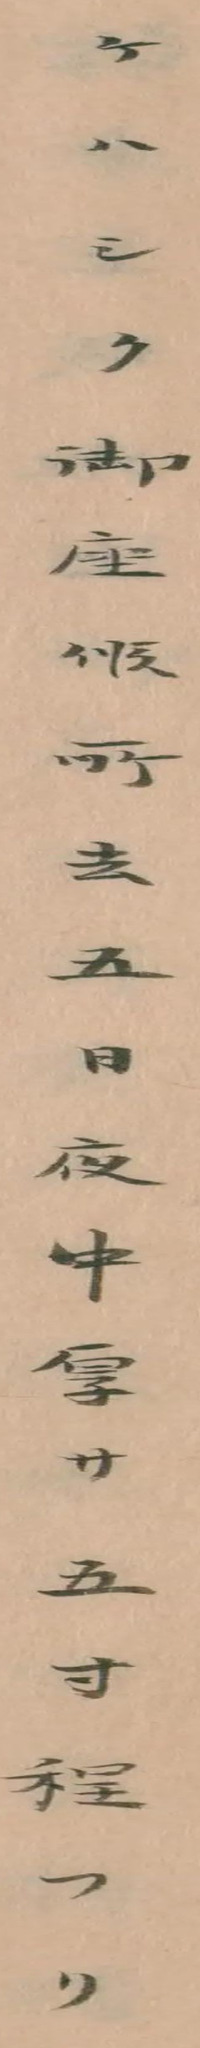ケハシク御座候所去五日夜中厚サ五寸程フリ
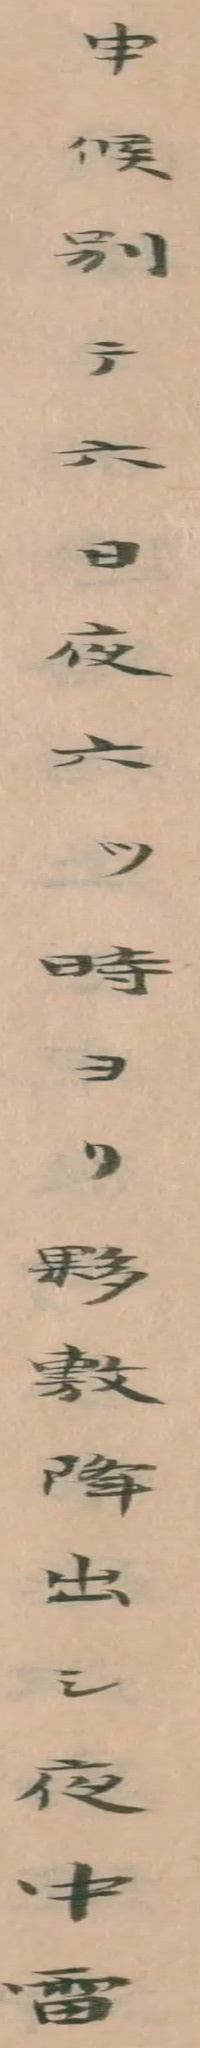申候別テ六日夜六ッ時ヨリ夥敷降出シ夜中雷
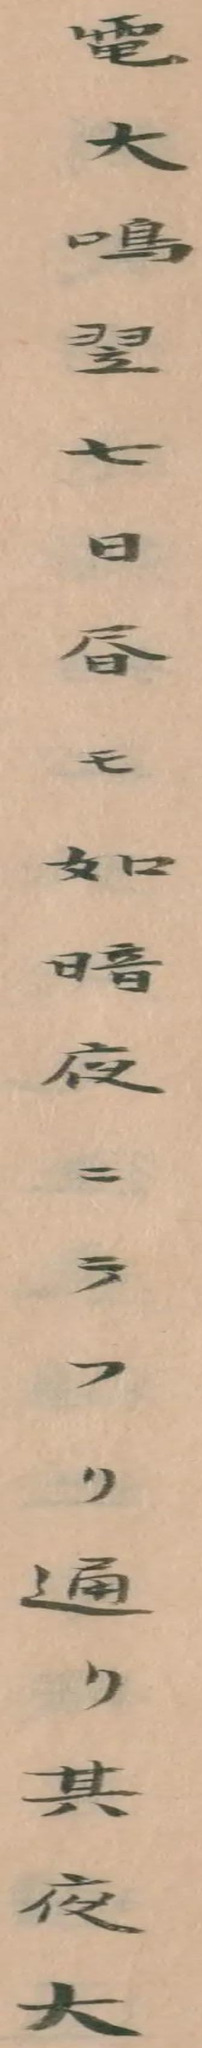電大鳴翌七日昼モ如暗夜ニテフリ通り其夜大
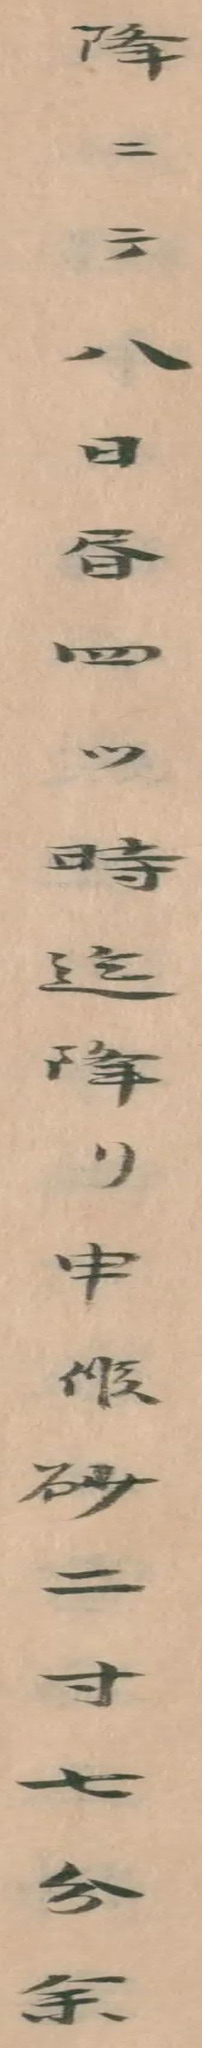降ニテ八日昼四ッ時迄降り申候砂二寸七分余
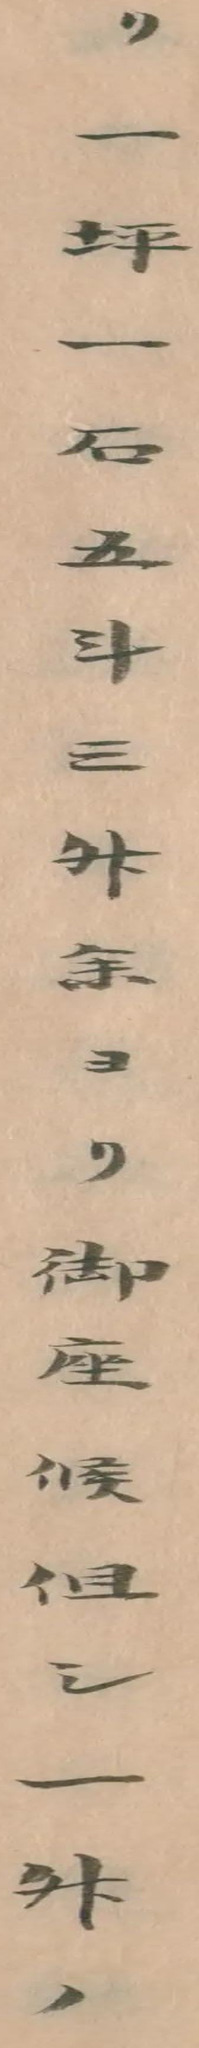リ一坪一石五斗三升余ヨリ御座候但シ一升ノ
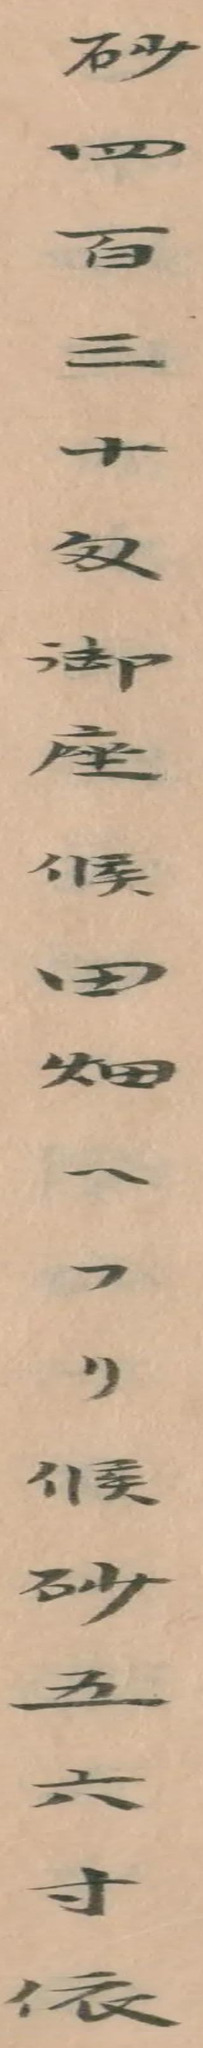砂四百三十匁御座候田畑へフリ候砂五六寸依

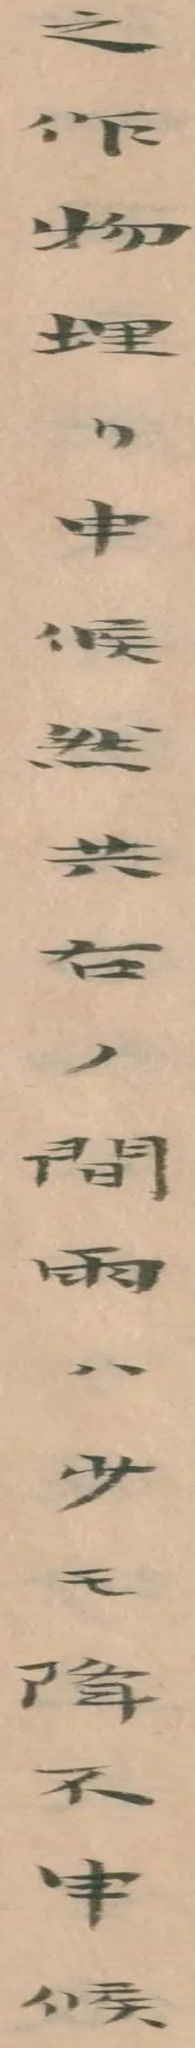之作物埋り申候然共右ノ間雨ハ少モ降不申候
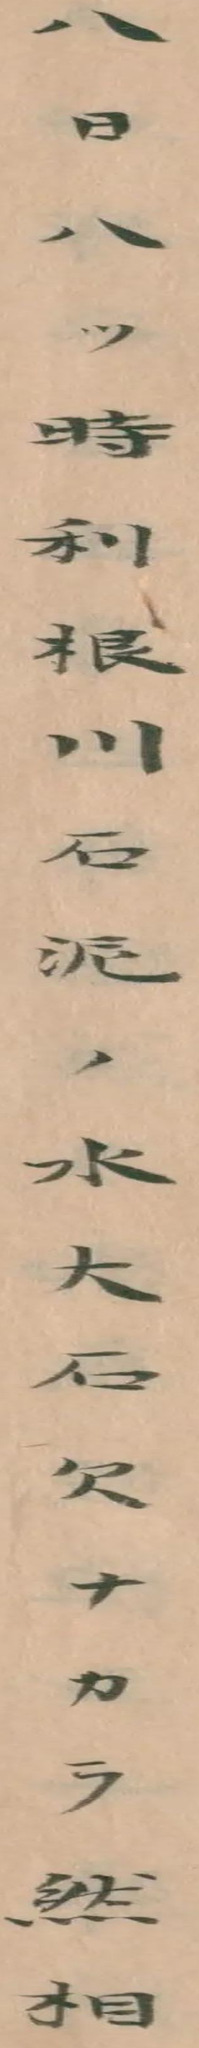八日八ッ時利根川石泥ノ水大石欠ナカラ然相
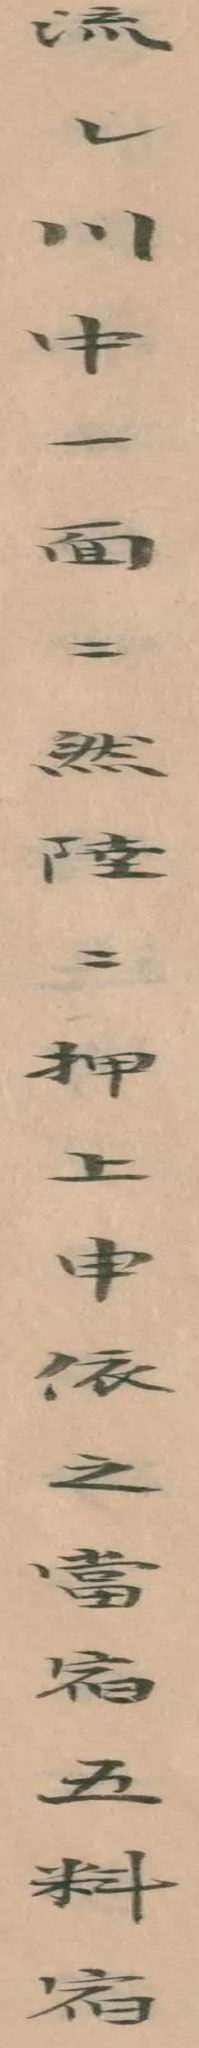流レ川中一面二然陸二押上申依之当宿五料宿
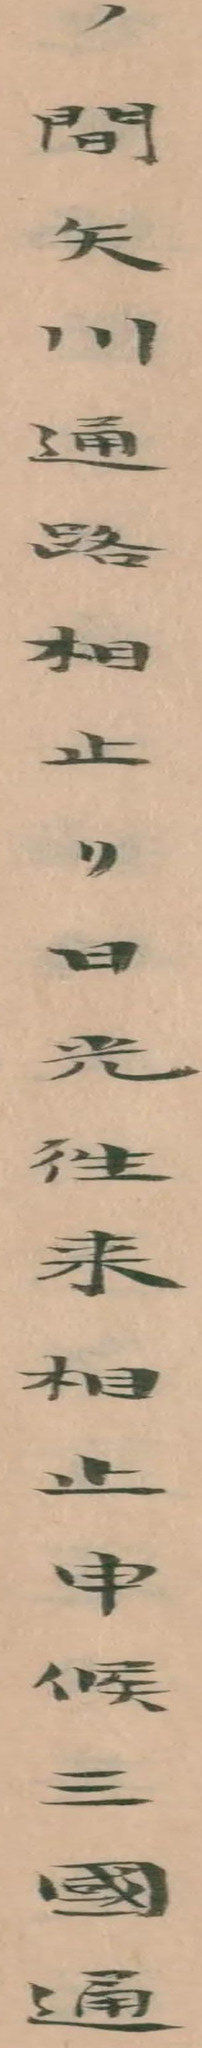ノ間矢川通路相止り日光往来相止申候三国通
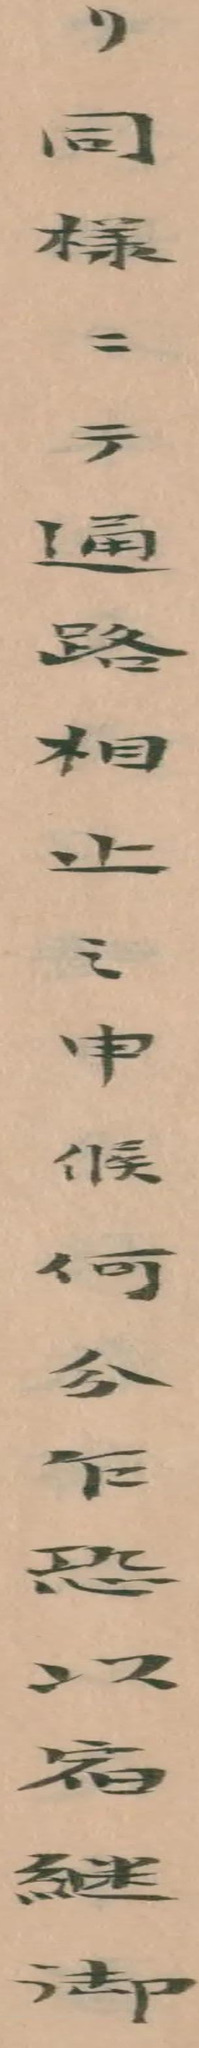り同様ニテ通路相止ミ申候何分乍恐以宿継御
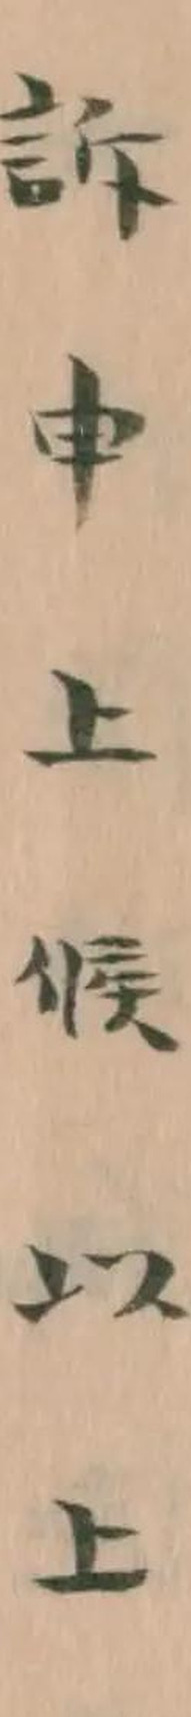訴申上候以上
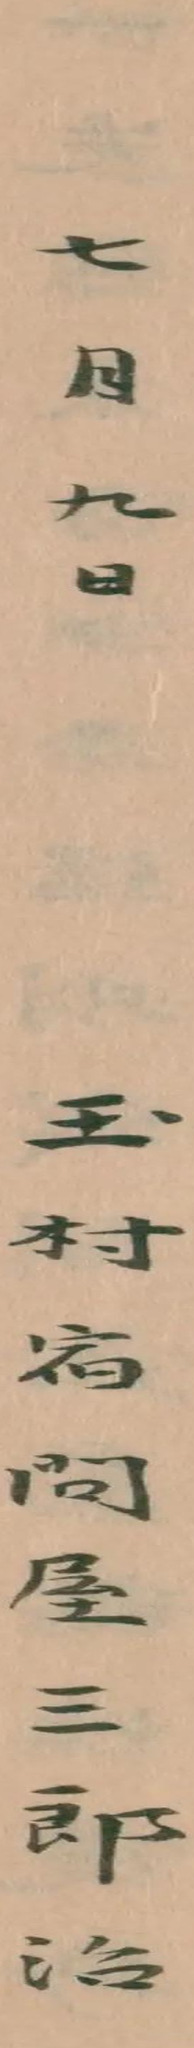七月九日玉村宿問屋三郎治
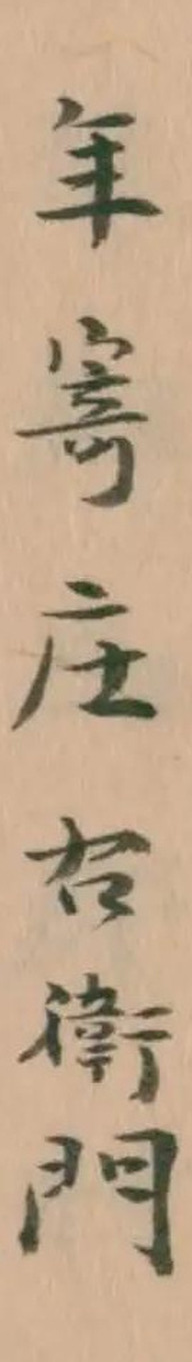年寄庄右衛門
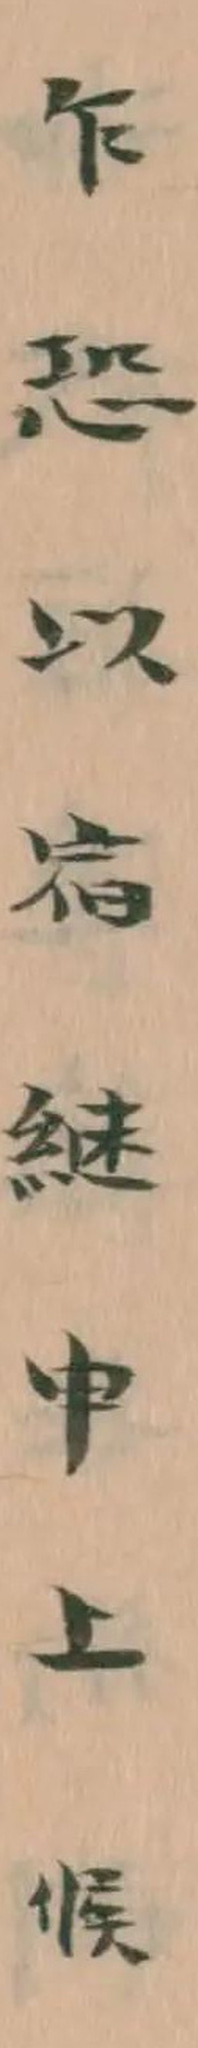乍恐以宿継申上候
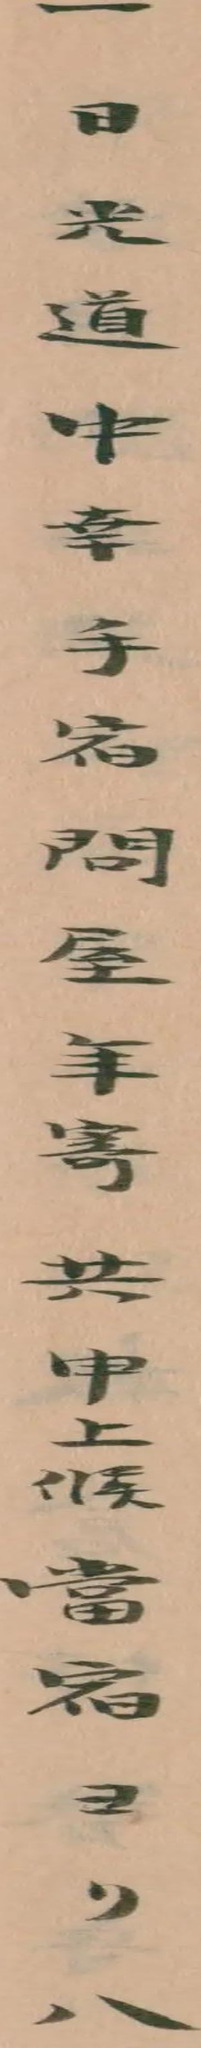一日光道中幸手宿問屋年寄共申上候当宿ヨリ八
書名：地災撮要. 巻3(地震之部)-巻4(噴火之部)
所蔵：国立国会図書館 National Diet Library, JAPAN
